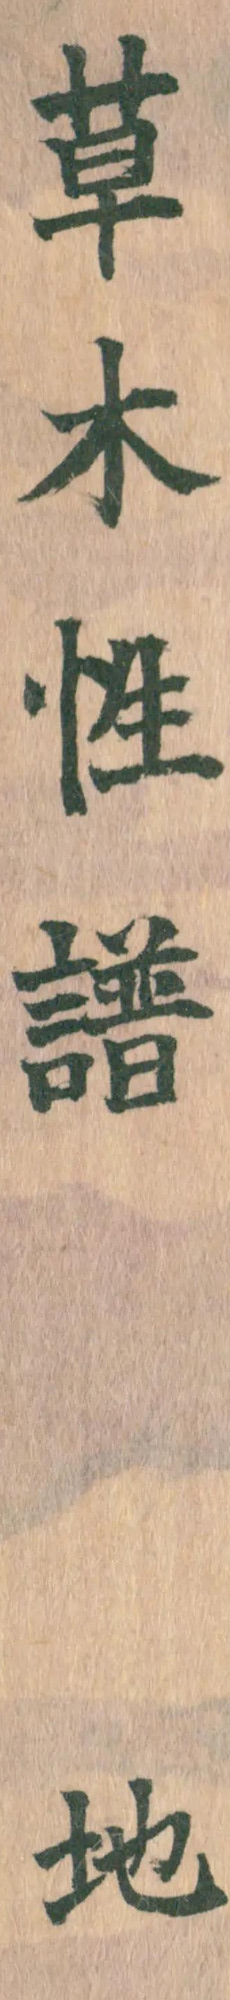草木性譜地

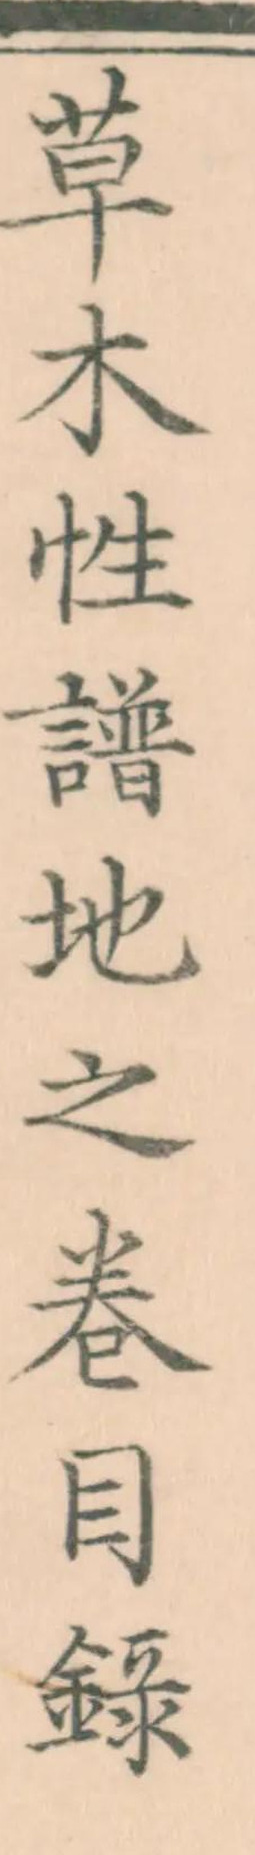草木性譜地之巻目録
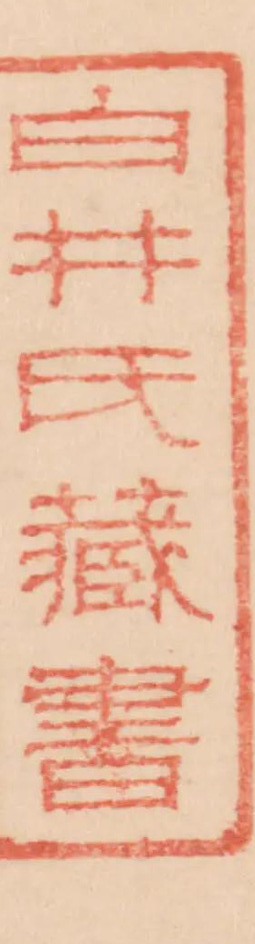白井氏蔵書
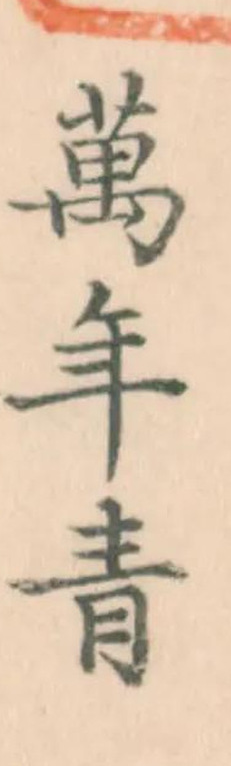万年青
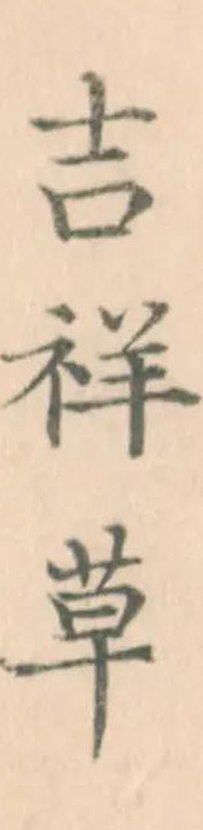吉祥草
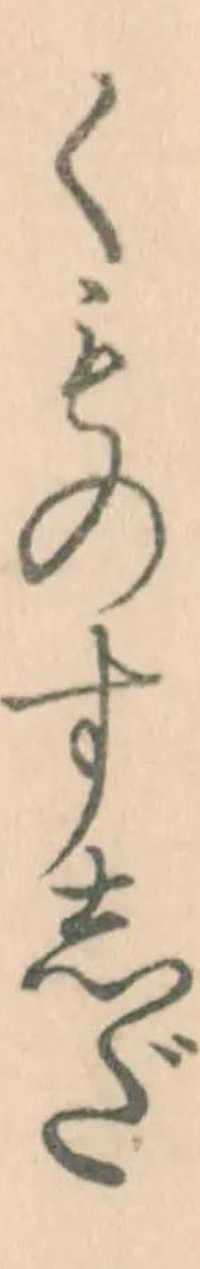くものすしだ

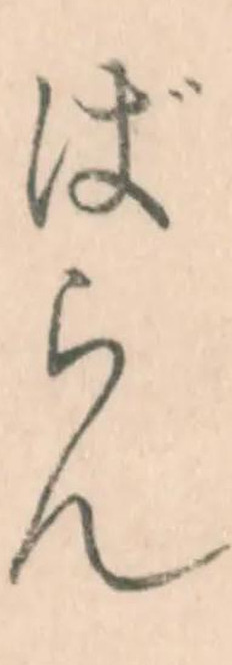ばらん
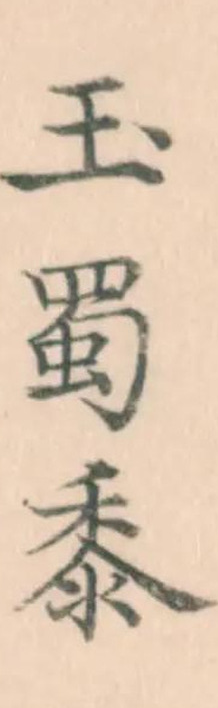玉蜀黍
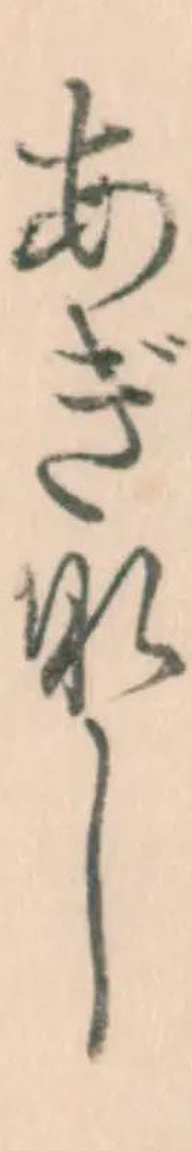あぎなし
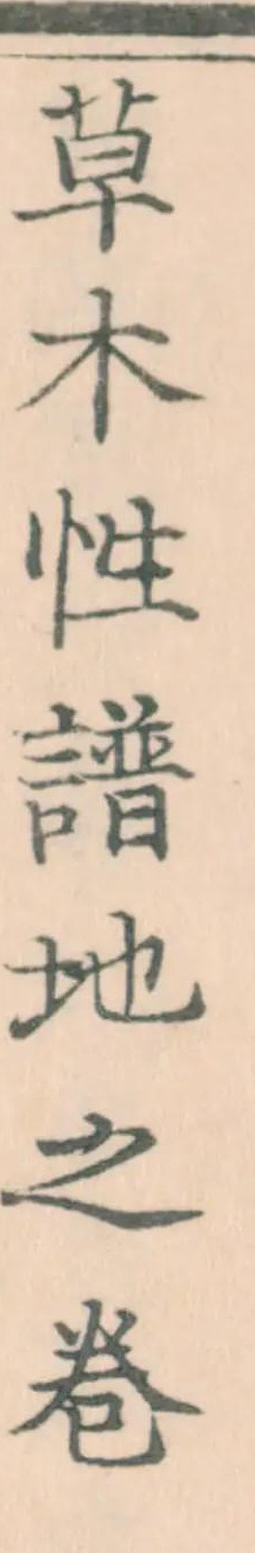草木性譜地之巻
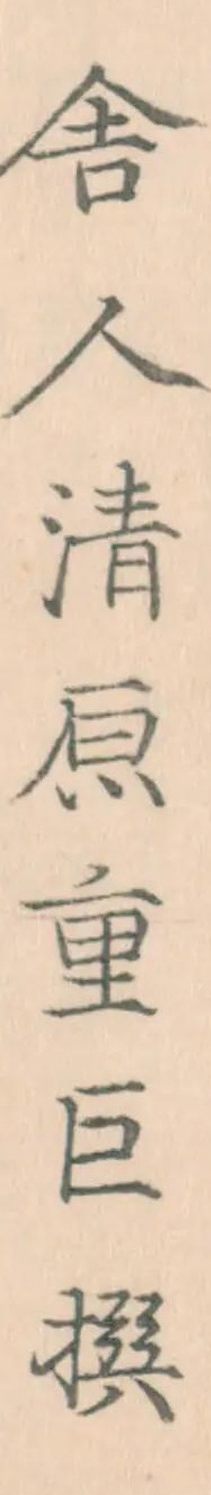舎人清原重巨撰
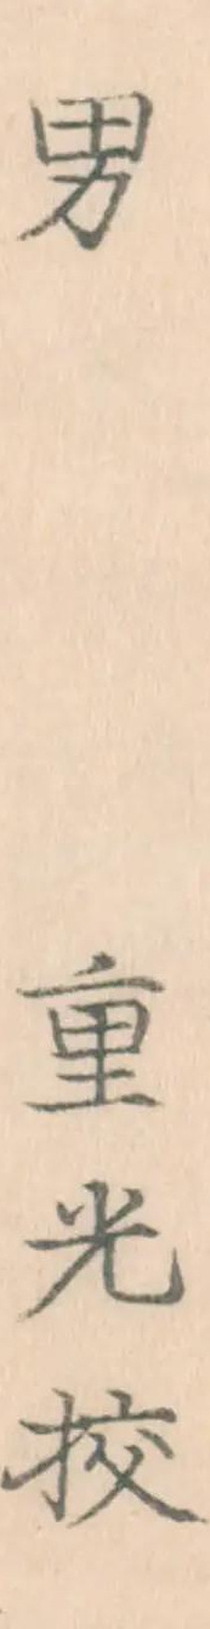男重光校

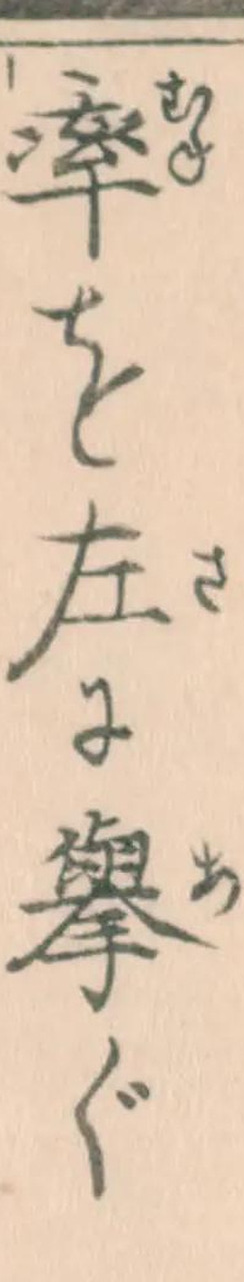-率を左に挙ぐ
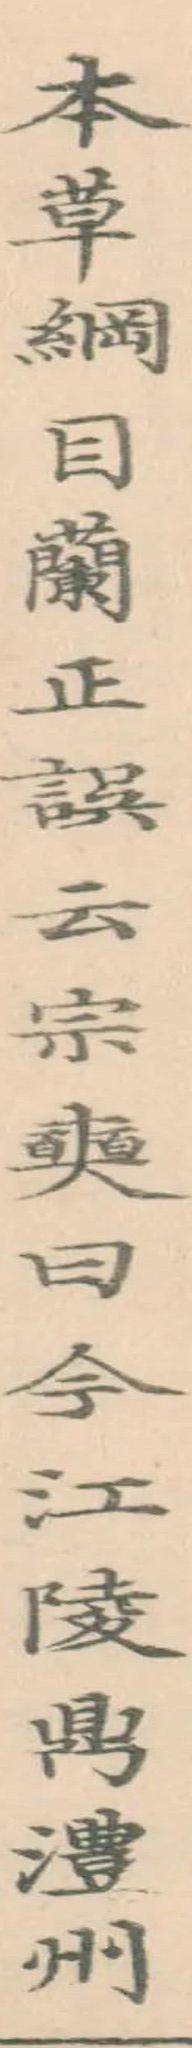本草綱目蘭正誤云宗奭曰今江陵鼎澧州
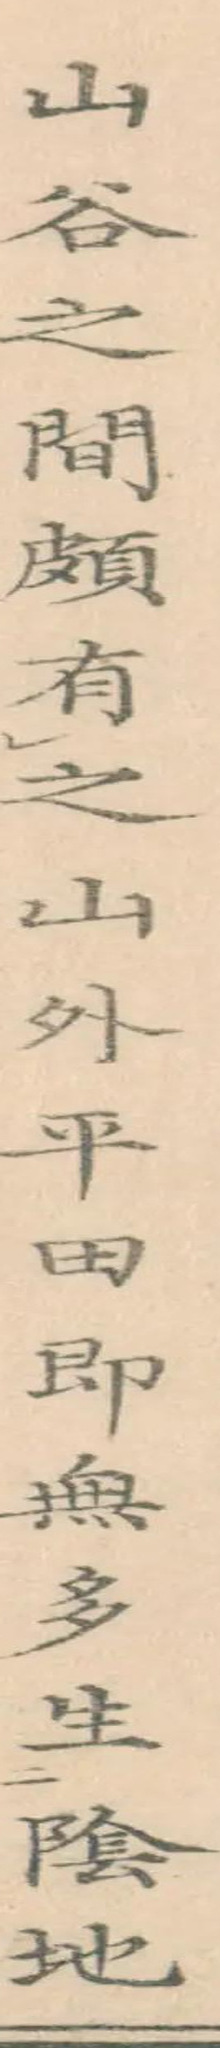山谷之間頗有之山外平田即無多生陰地

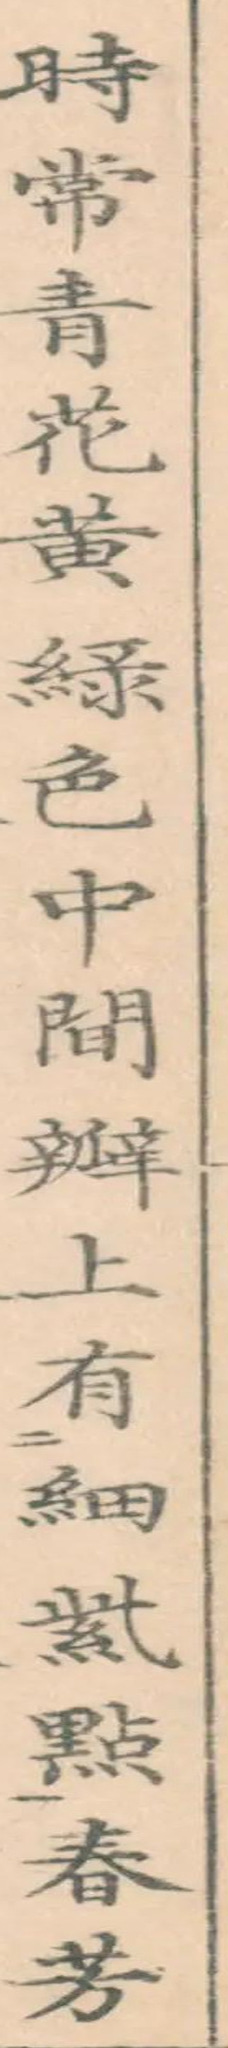時常青花黄緑色中間瓣上有細紫点春芳
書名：草木性譜 3巻. [2]
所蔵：国立国会図書館 National Diet Library, JAPAN
